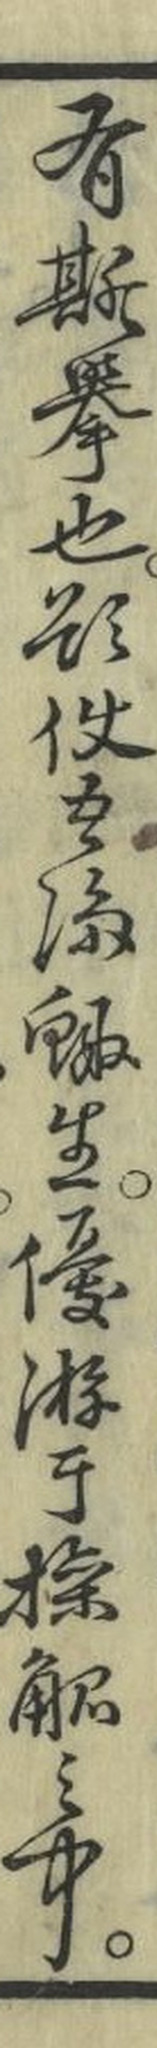有斯擧也。欲使吾濟鮮生。優游于操觚之中。
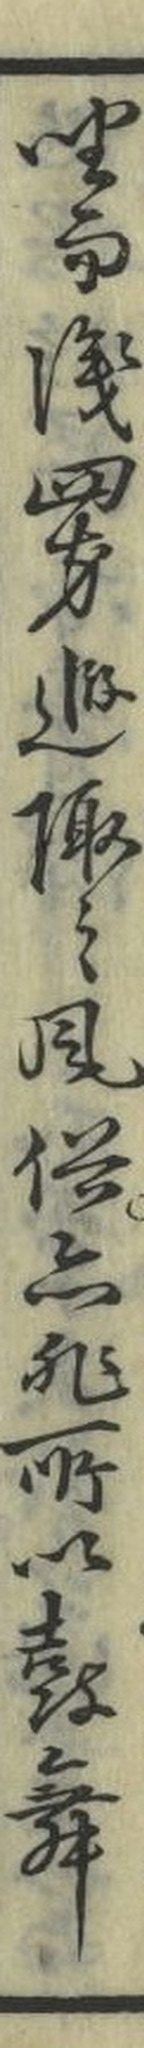聞而識四方遐陬之風俗。亦非所以鼓舞

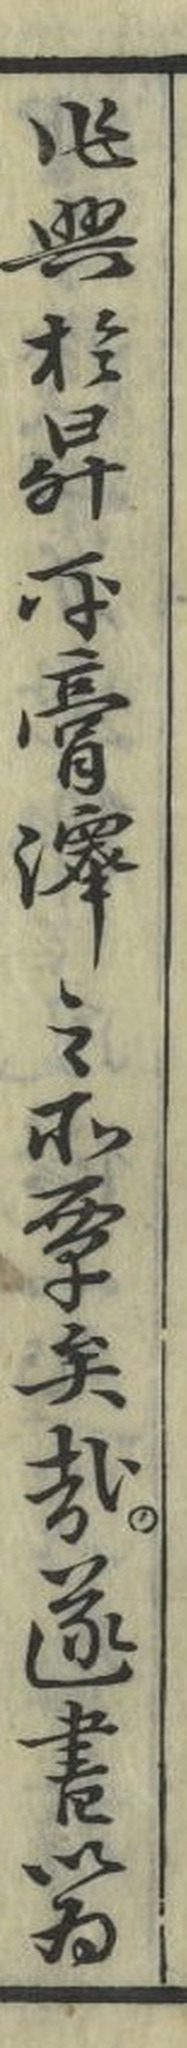非興於昇平膏澤之所覃矣哉。遂書以為
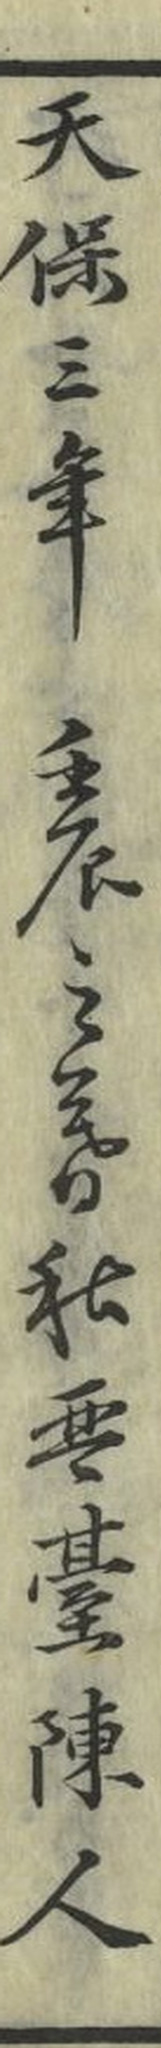天保三年壬辰之暮秋琴臺陳人
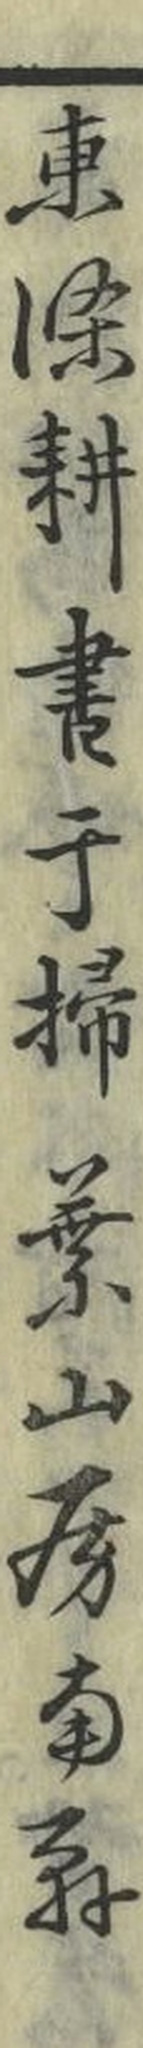東條耕書于掃葉山房南尉
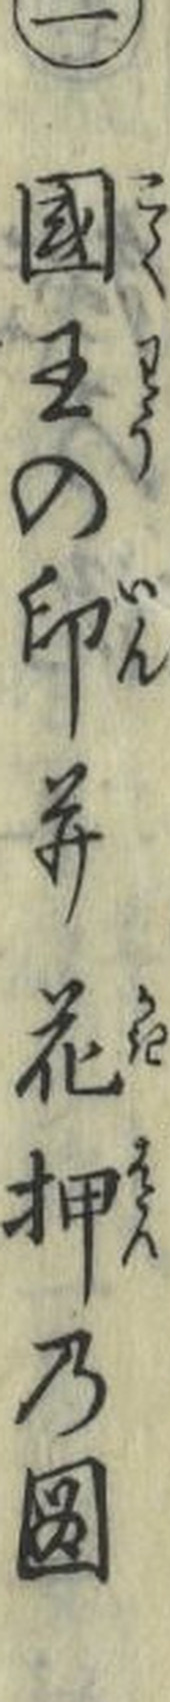二国王の印并花押の図
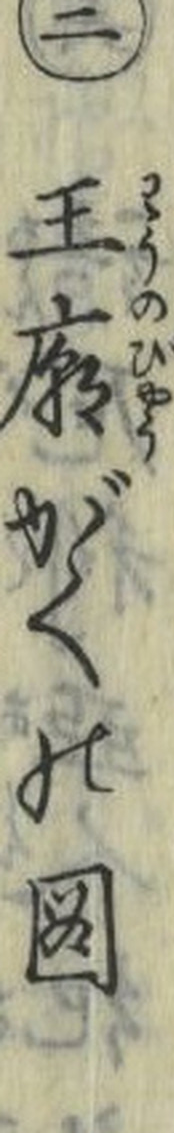三王廟がくの図
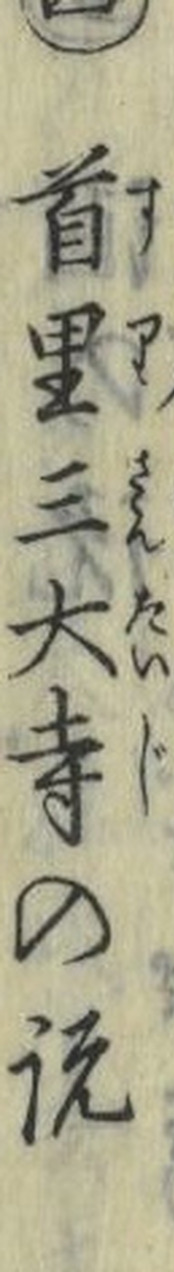四首里三大寺の説
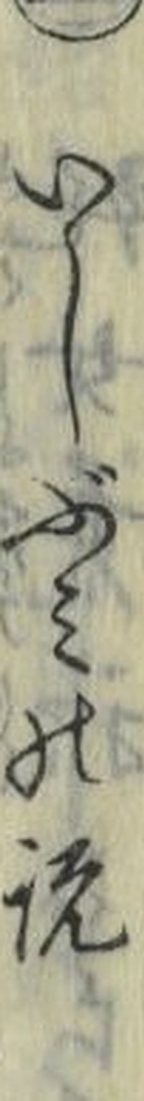五いしぶみの説
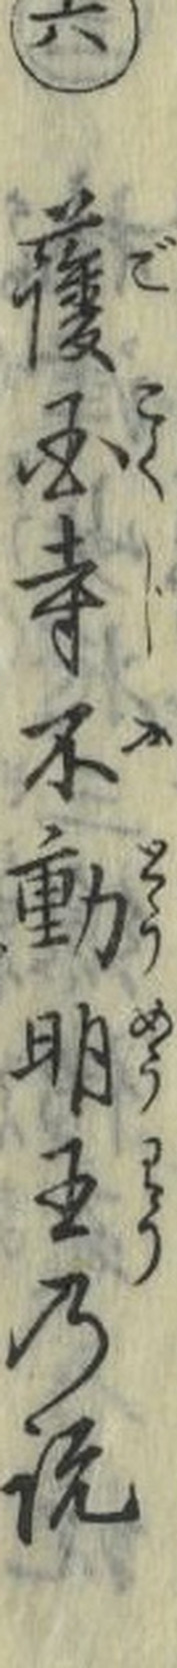六護国寺不動明王の説
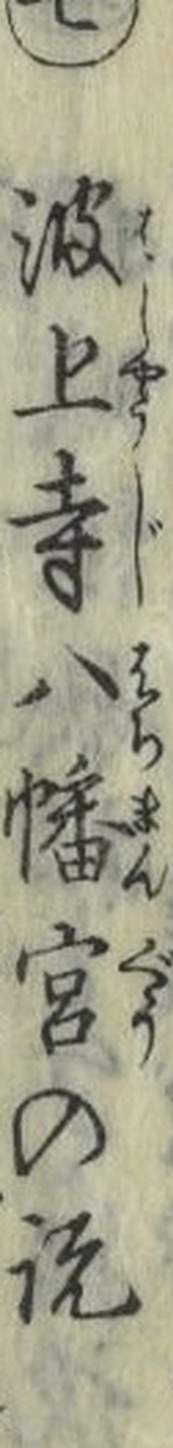七波上寺八幡宮の説
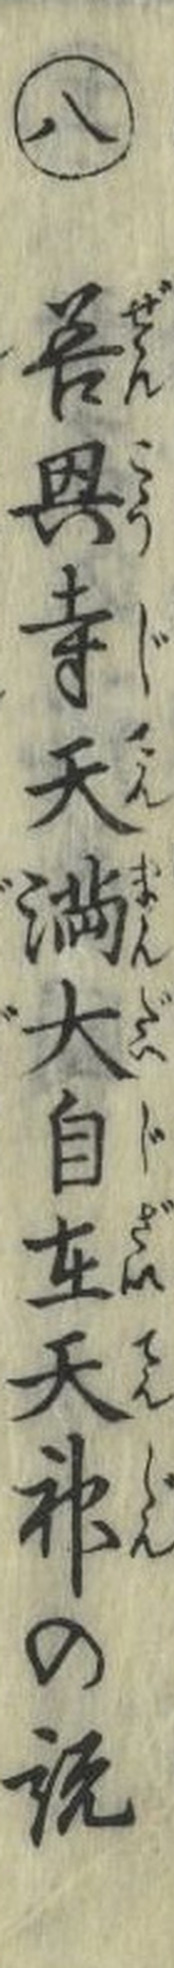八善興寺天満大自在天神の説
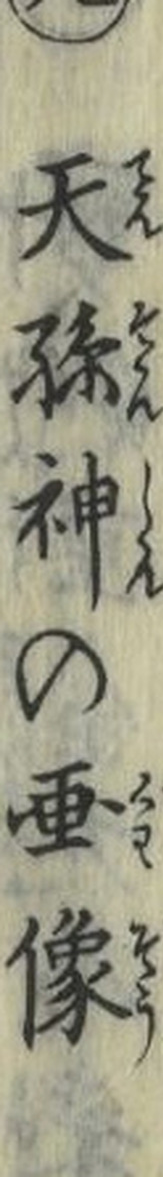九天孫神の画像

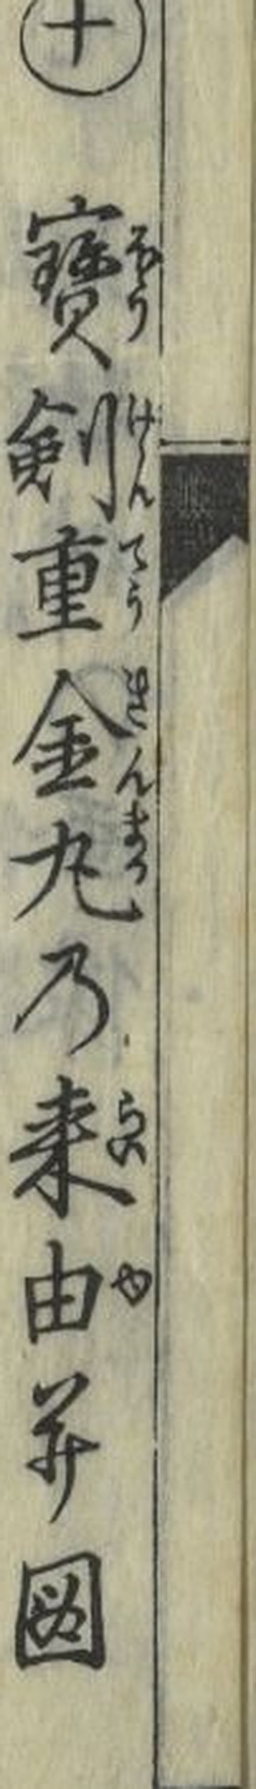十寶剣重金丸の来由并図
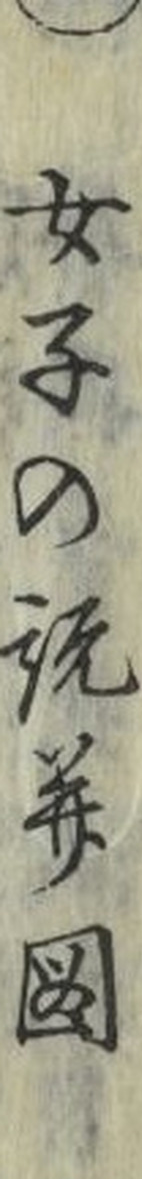十一女子の説并図
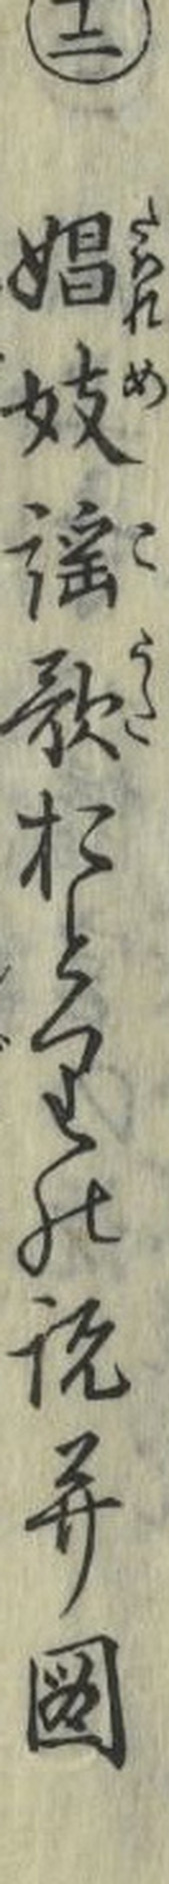十二娼妓謡歌おとりの説并図
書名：琉球秊代記 附雑話 全
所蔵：University of the Ryukyus Library
